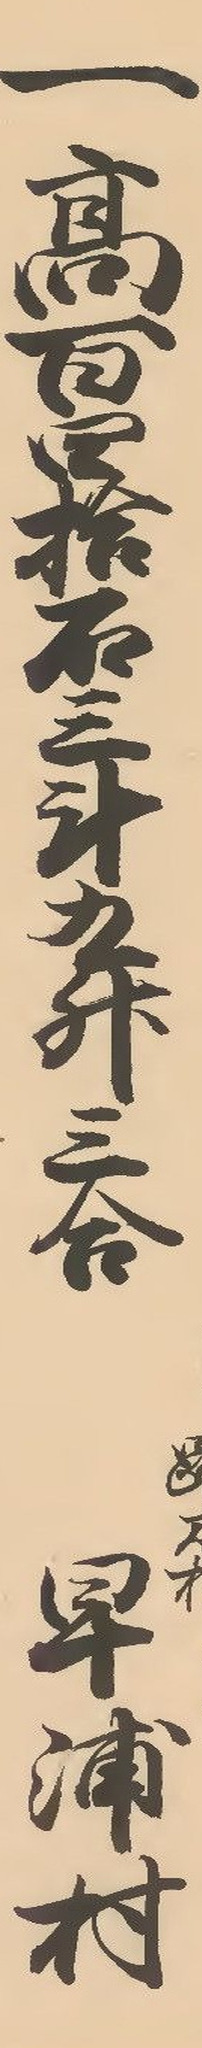一髙百四拾石三斗九升三合早浦村
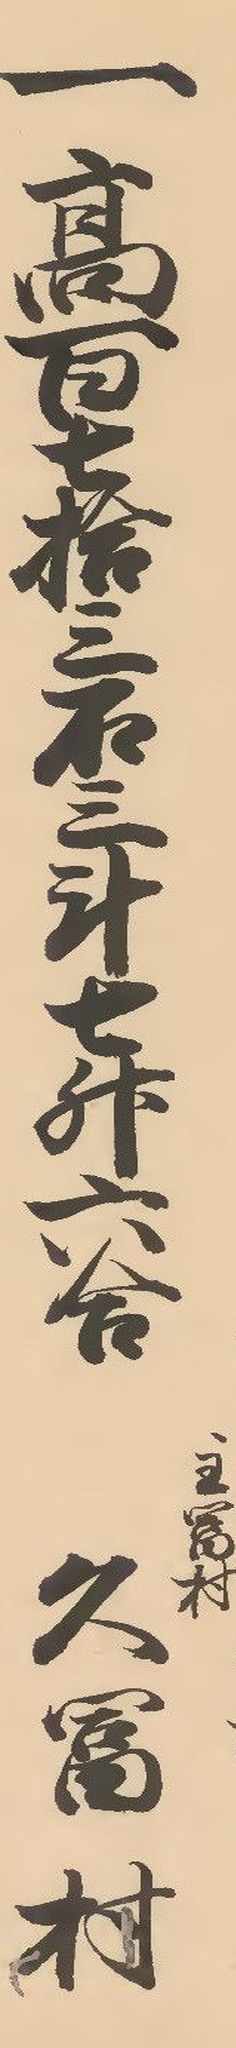一髙百七拾三石三斗七升六合久冨村
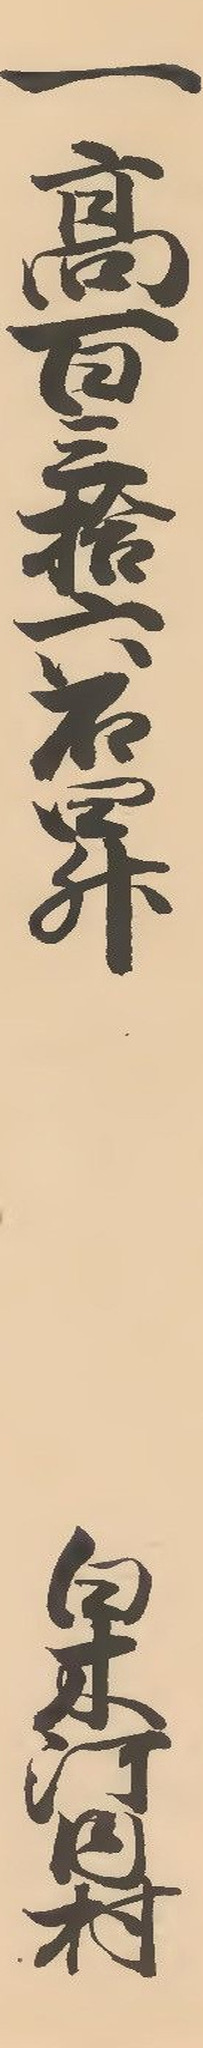一髙百三拾六石四升白木河内村
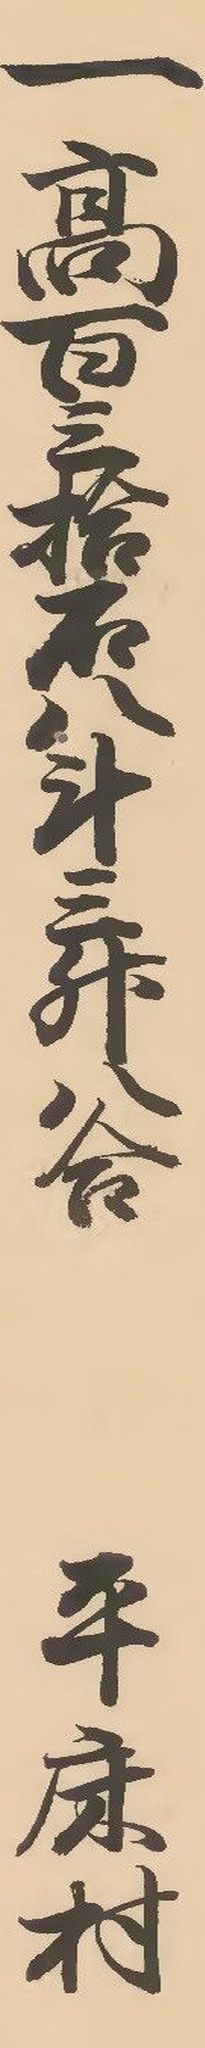一髙百三拾石八斗三升八合平床村
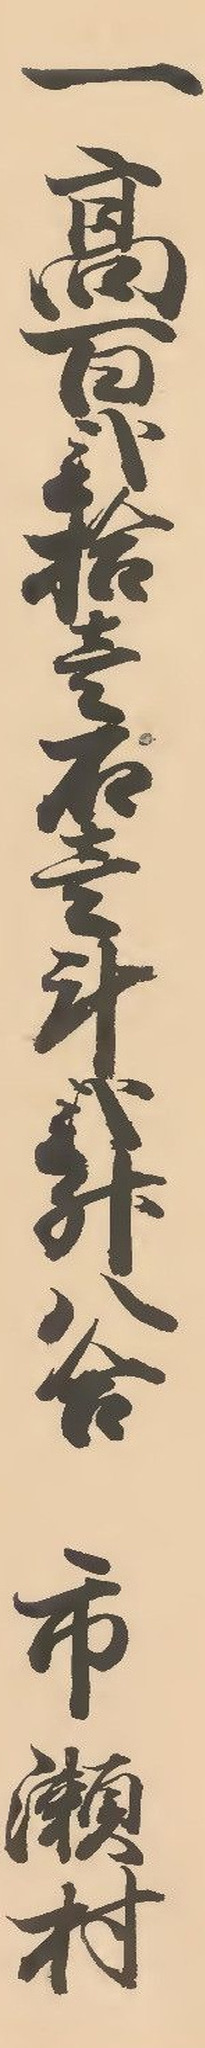一髙百弐拾壱石壱斗弐升八合市瀬村
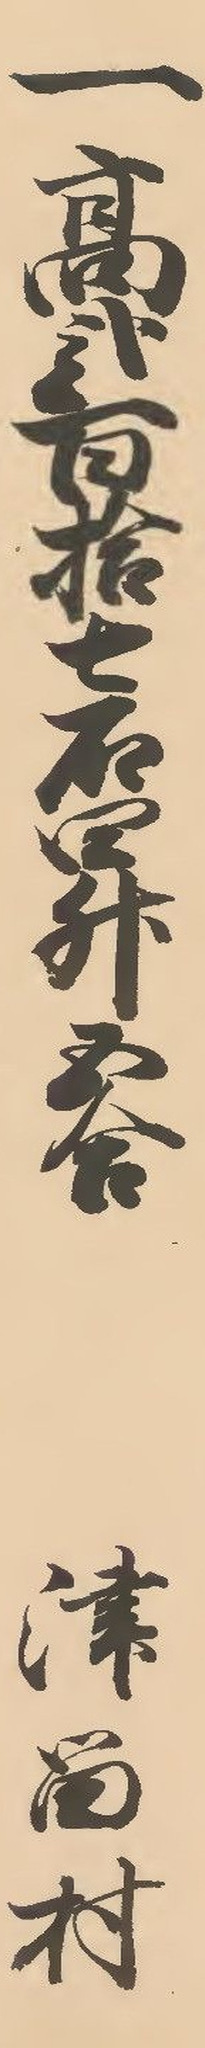一髙弐百拾七石四升五合津留村
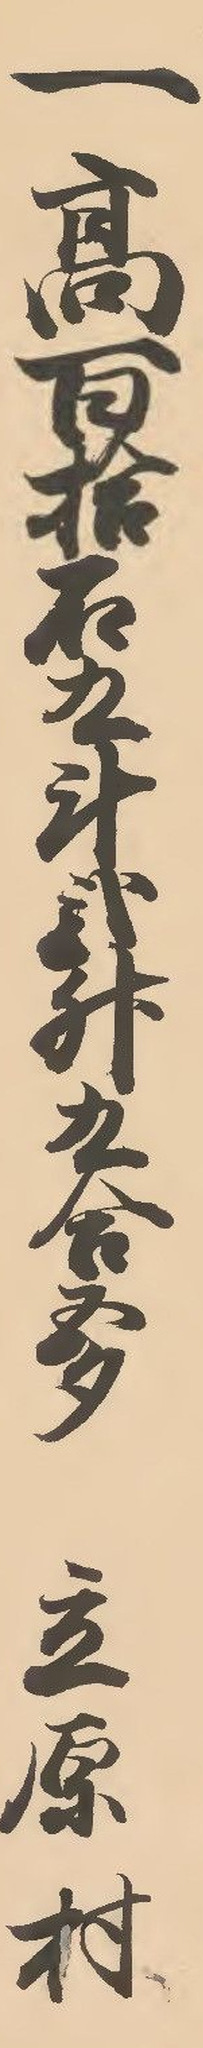一髙百拾石九斗弐升九合五夕立原村
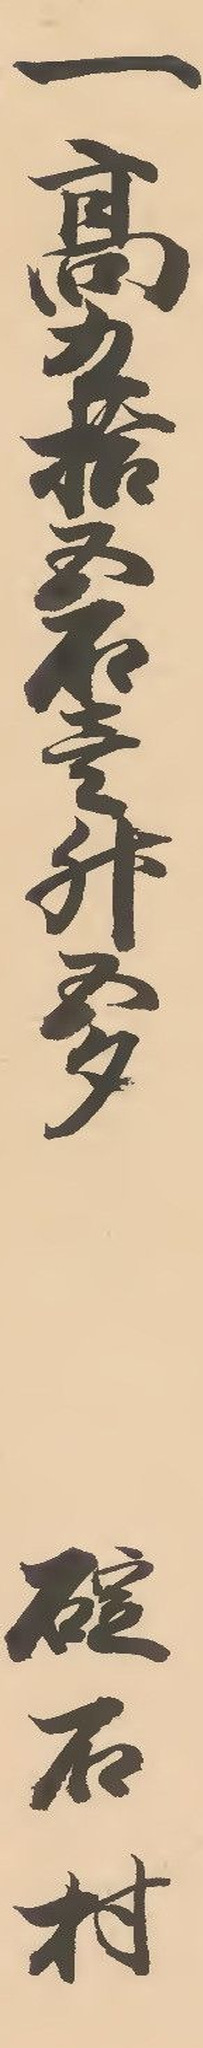一髙九拾五石壱升五夕碇石村

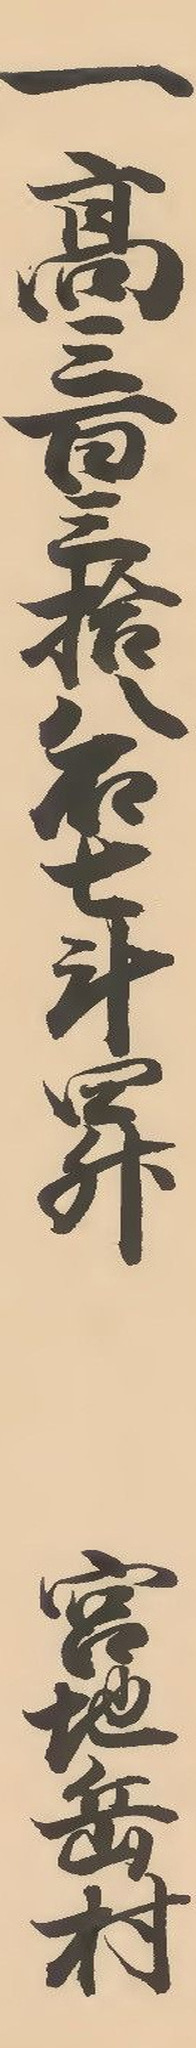一髙三百三拾八石七斗四升宮地岳村
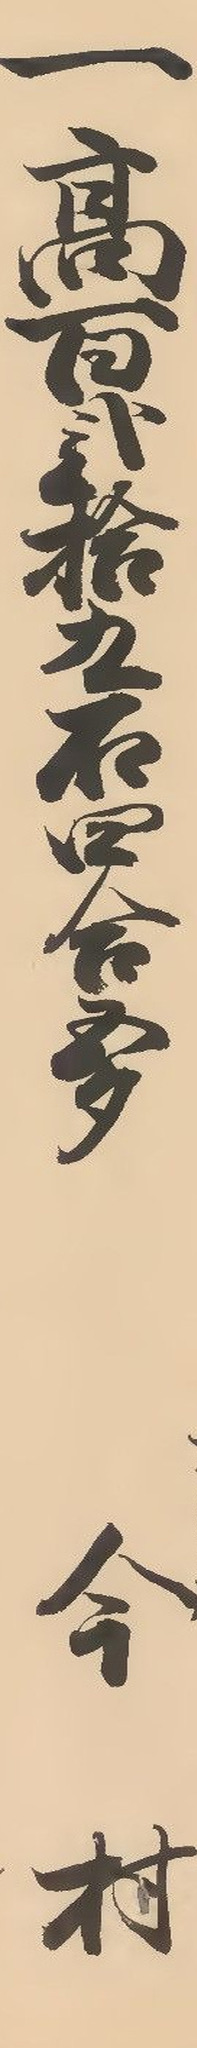一髙百弐拾九石四合五夕今村
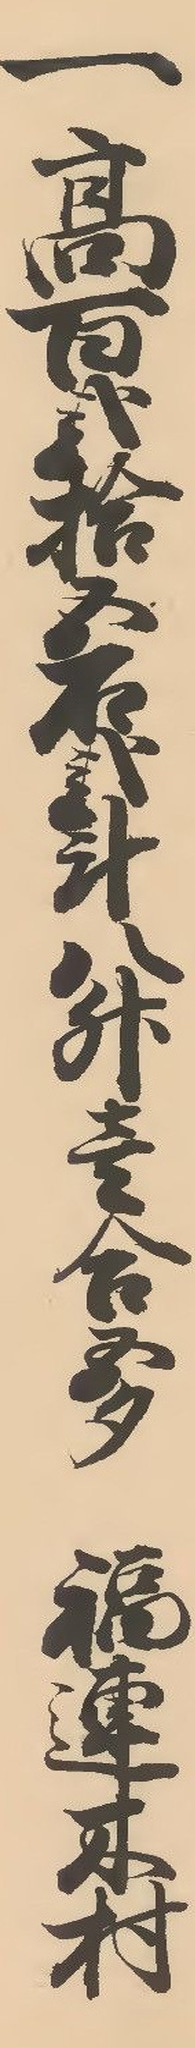一髙百弐拾五石弐斗八升壱合五夕福連木村
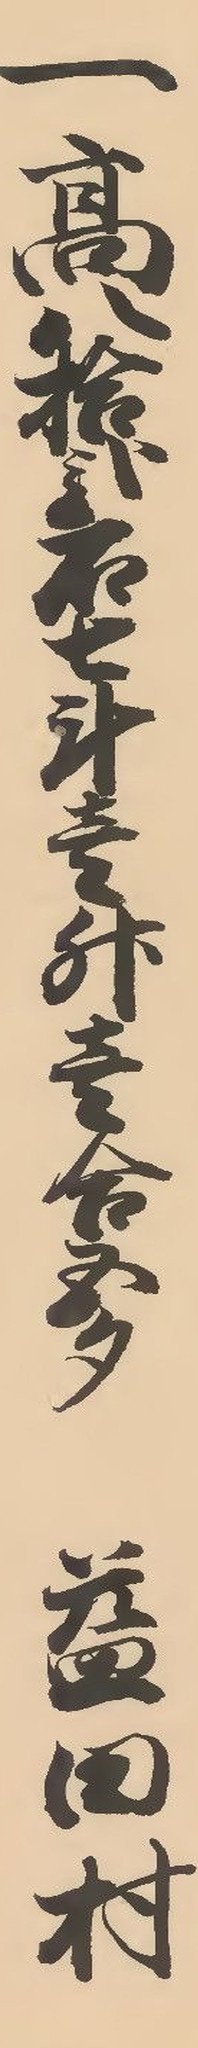一髙八拾弐石七斗壱升壱合五夕益田村
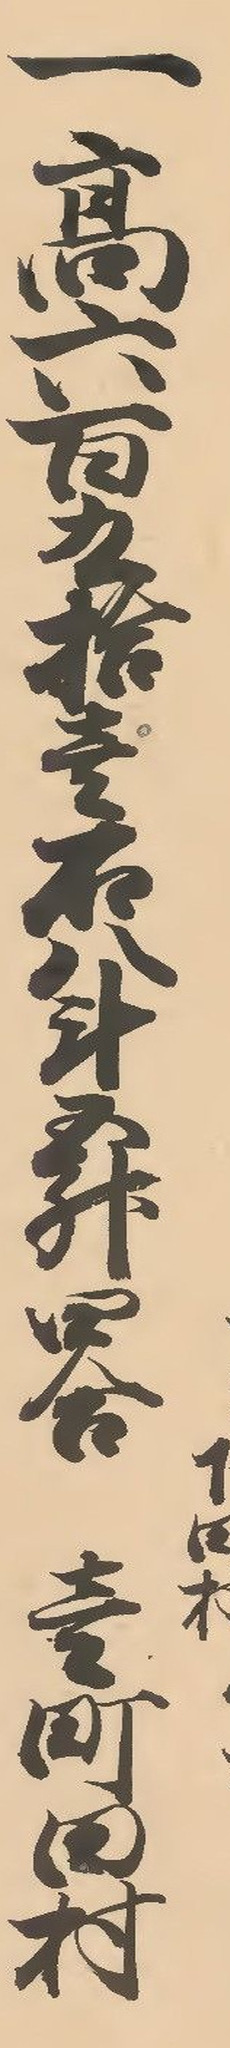一髙六百九拾壱石八斗五升四合壱町田村
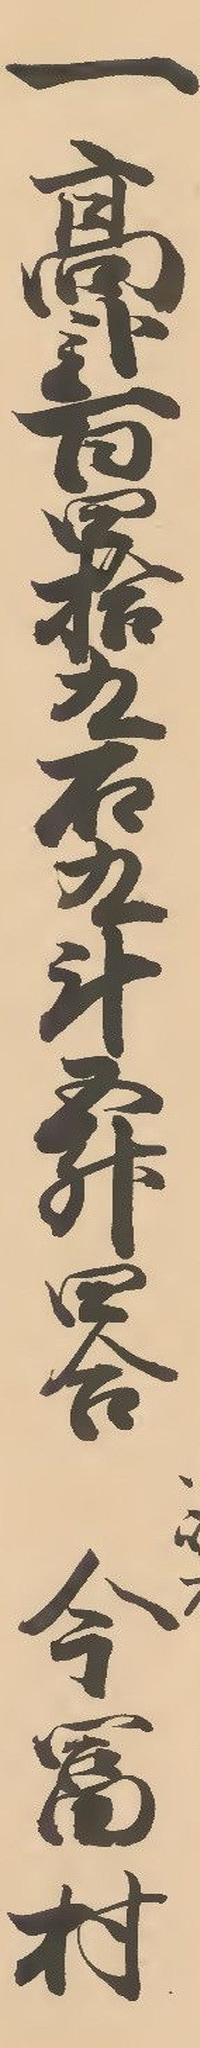一髙弐百四拾九石九斗五升四合今冨村
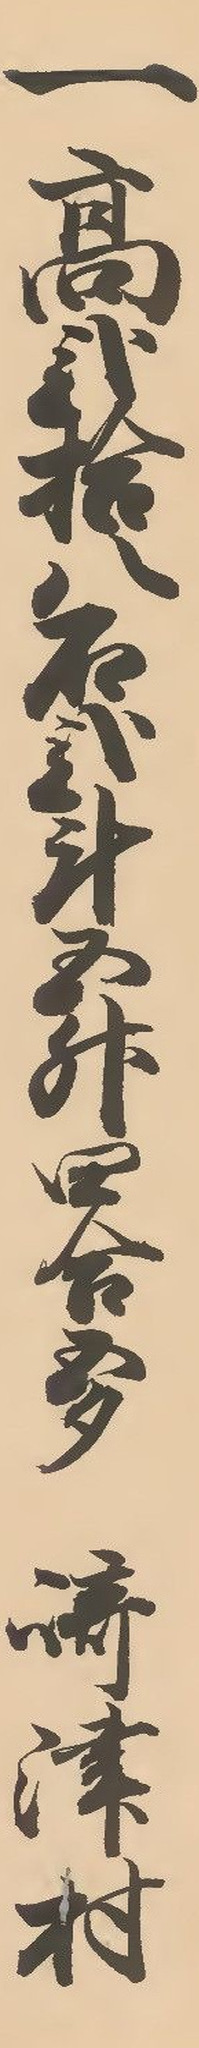一髙弐拾八石弐斗五升四合五夕崎津村
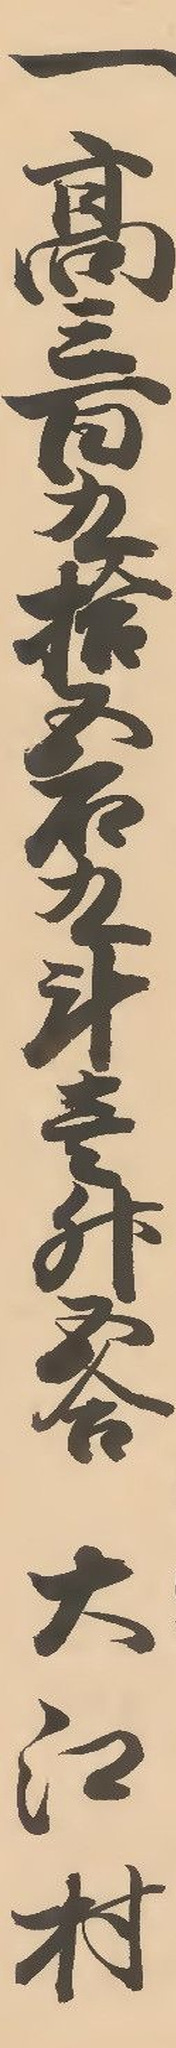一髙三百九拾五石九斗壱升五合大江村
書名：肥後国郷帳
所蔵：国立公文書館 National Archives of Japan
